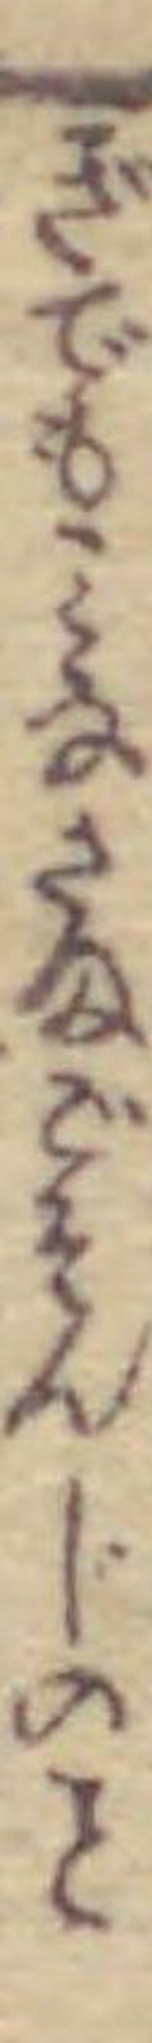ぎでもみなさまごそんじのこと
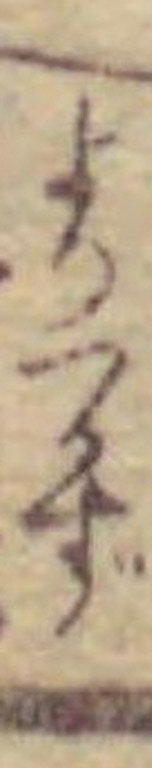よりつかず
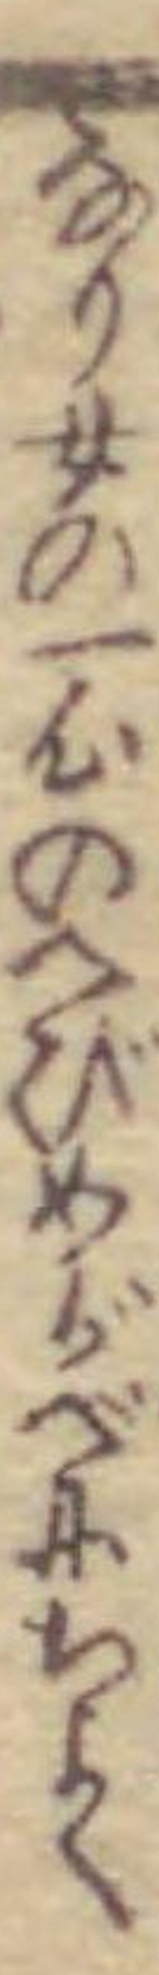なり女の一心のへびめがべにちよく
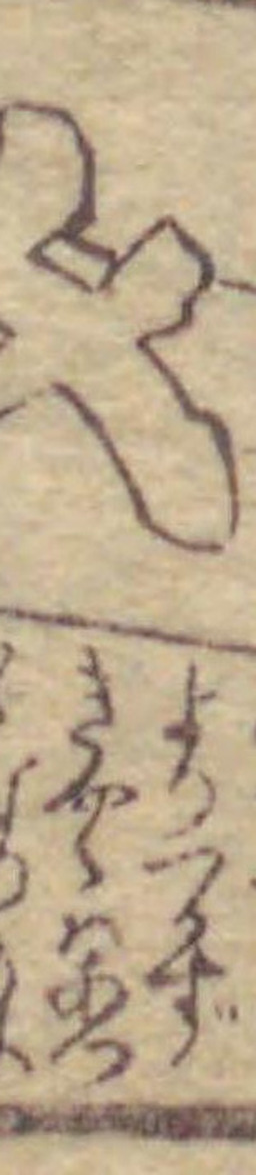きやくはあつ
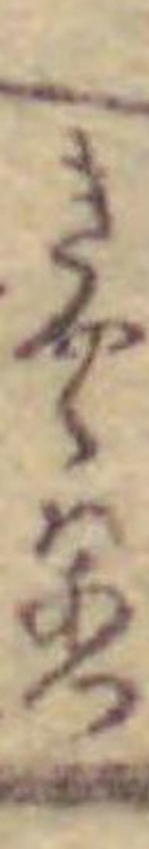きやくはあつ
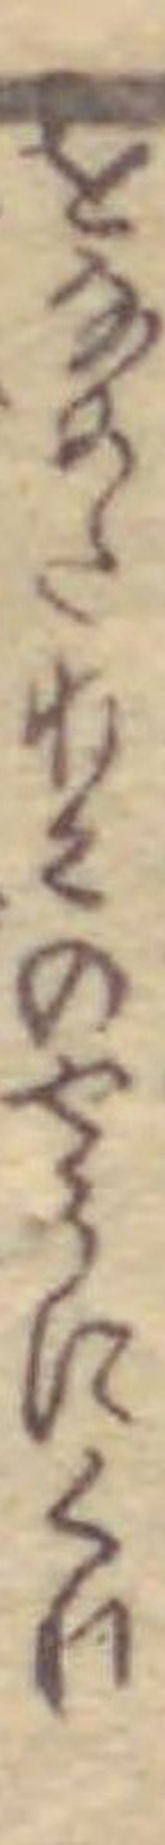をなめたねこのやうにくれ
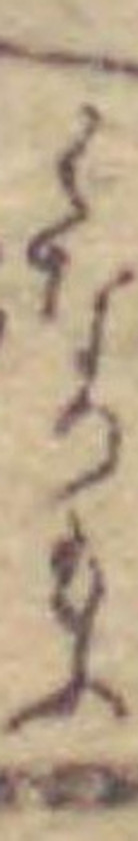くなりもふ
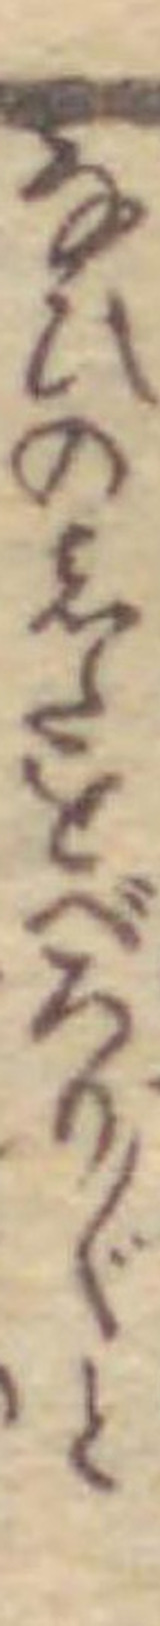なひのしたをべろり〴〵と
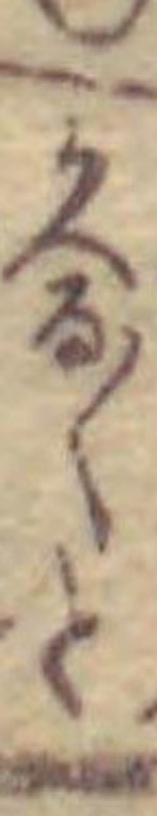かへる〳〵と
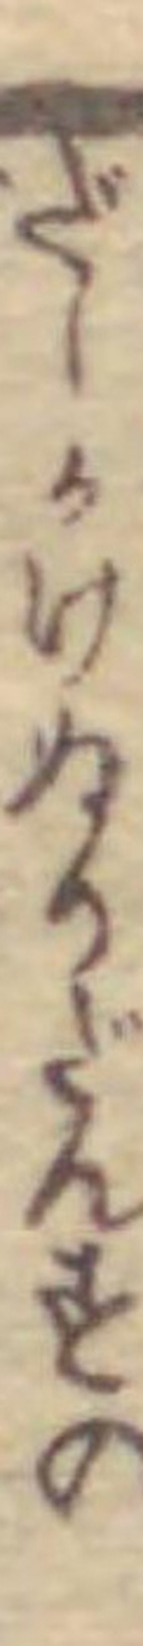だしかけぬりだんすの
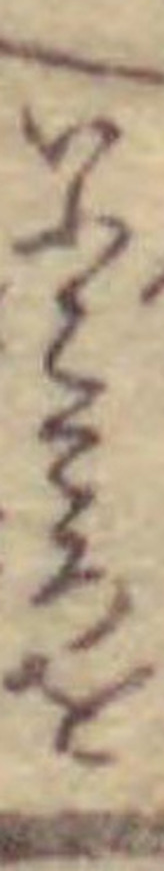いふところを
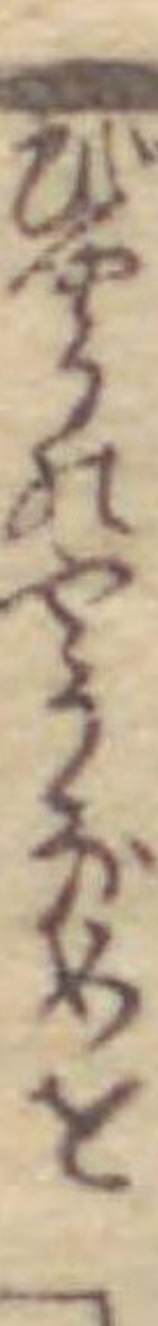びやうのやうなめを
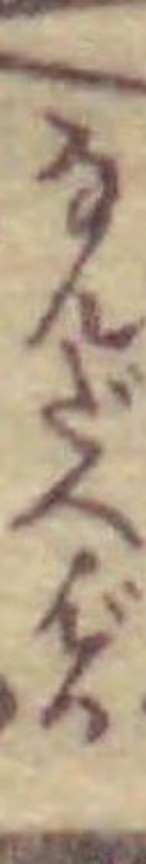なんだへばか
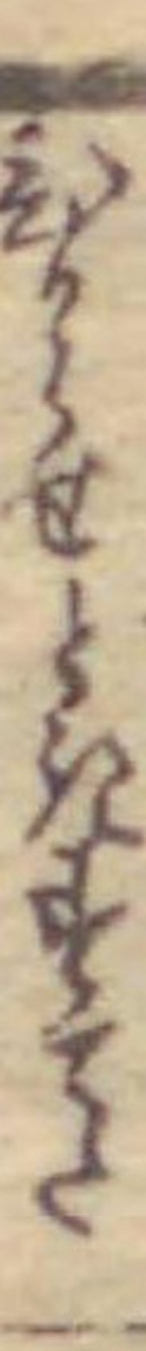ひからせときすてた
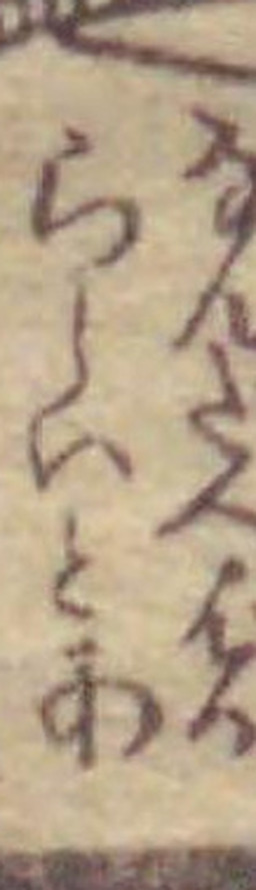らしいとあ
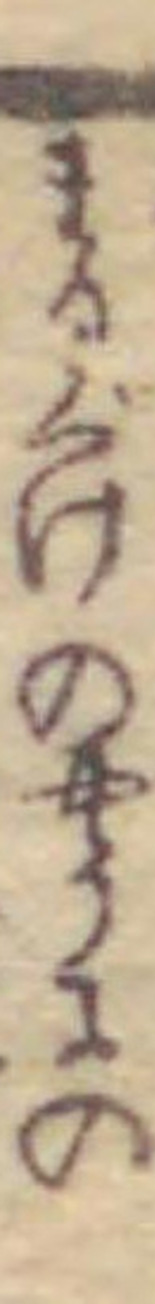まるぐけのやうにの
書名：御誂染長寿小紋 : 3巻
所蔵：国立国会図書館 National Diet Library, JAPAN
